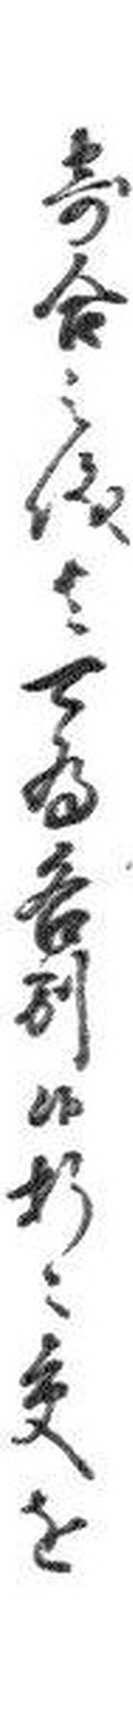寄合之儀者可為各別候折々交を

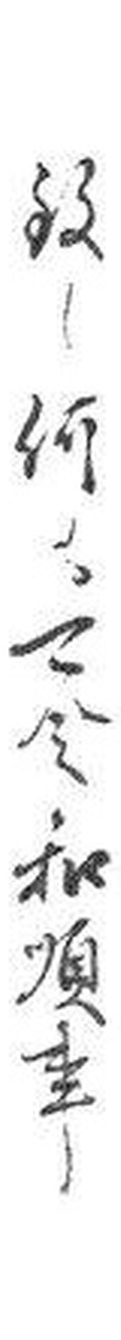致し何も可令和順事
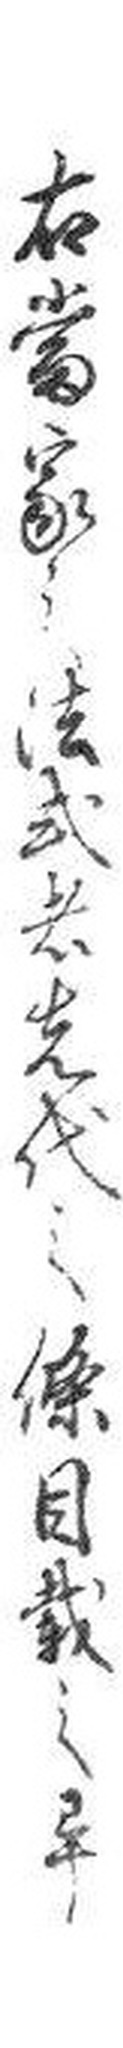右当家之法式者先代之條目載之畢
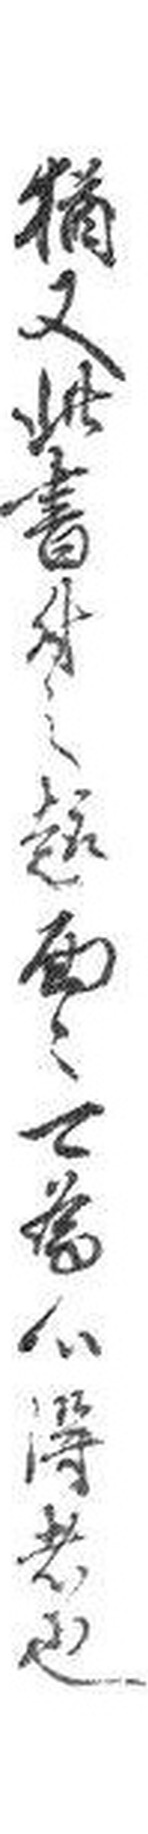猶又此書付之趣面々可為心得者也
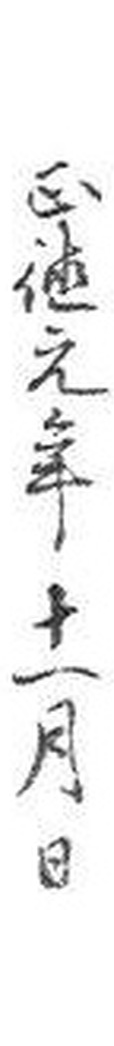正徳元年十一月日
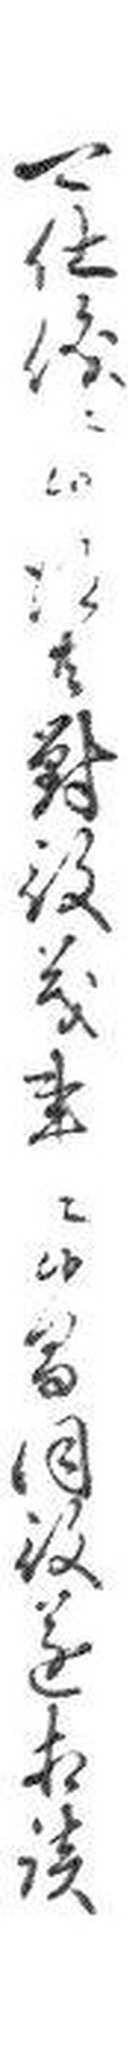可仕儀ニ候得共対役義事ニ候間同役遂相談
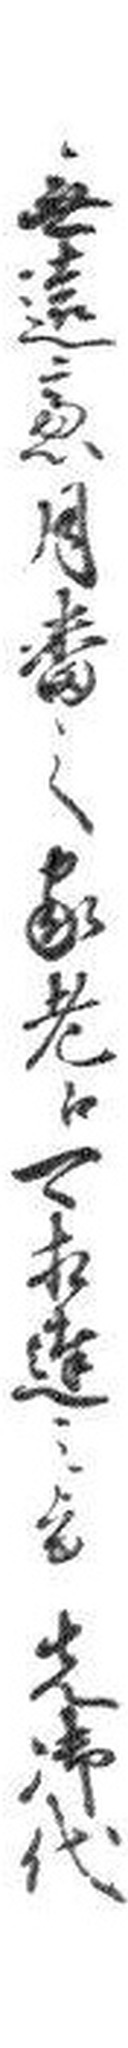無遠慮月番之家老江可相達之旨先御代
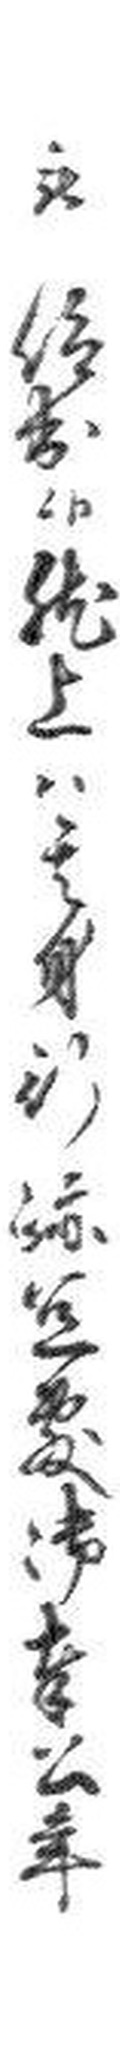被仰出候然上ハ其身行跡宜敷御奉公年
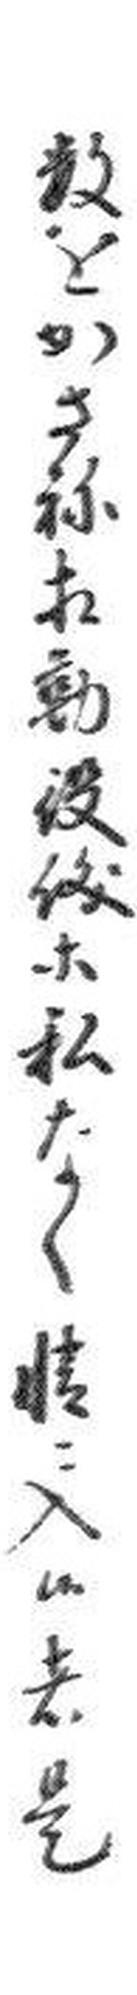数をかさね相勤役儀等私なく情ニ入候者是
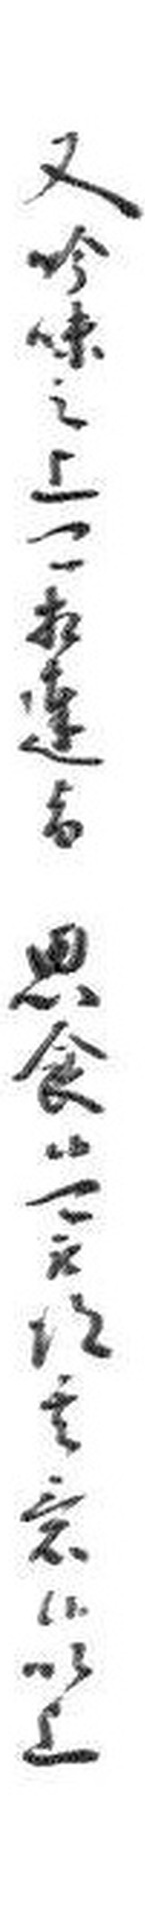又吟味之上可相達旨思食候可被得其意候以上
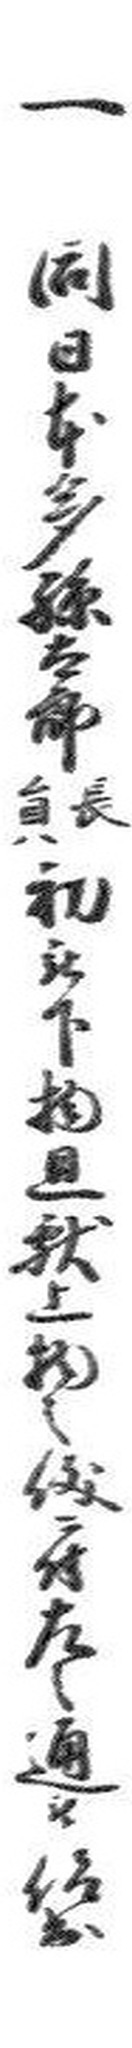一同日本多孫太郎長員初被下物且献上物之儀ニ付左之通被仰出
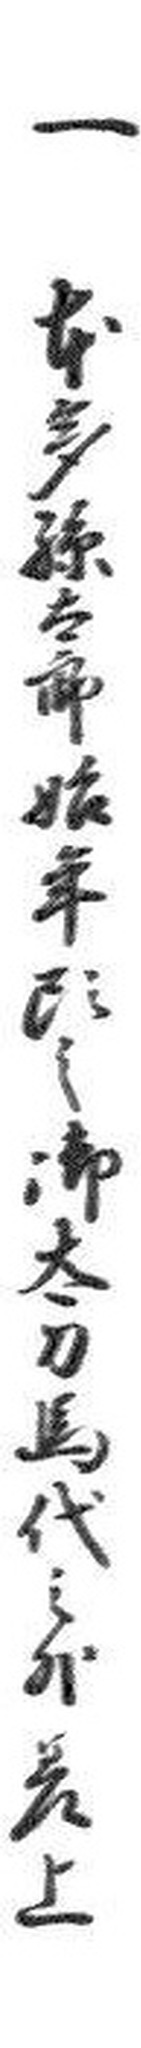一本多孫太郎始年頭之御太刀馬代之外差上
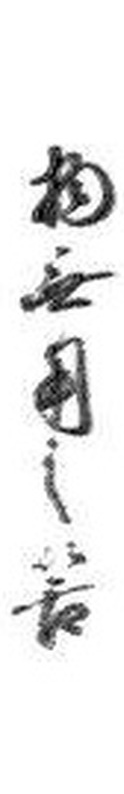物無用之筈
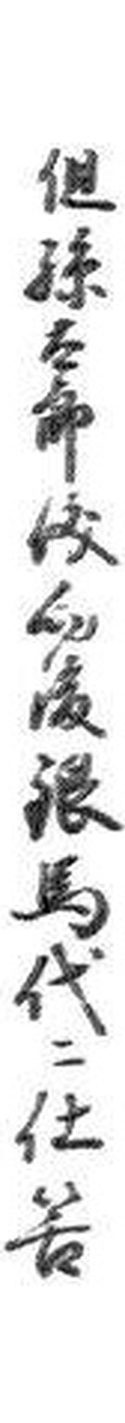但孫太郎儀向後銀馬代ニ仕筈
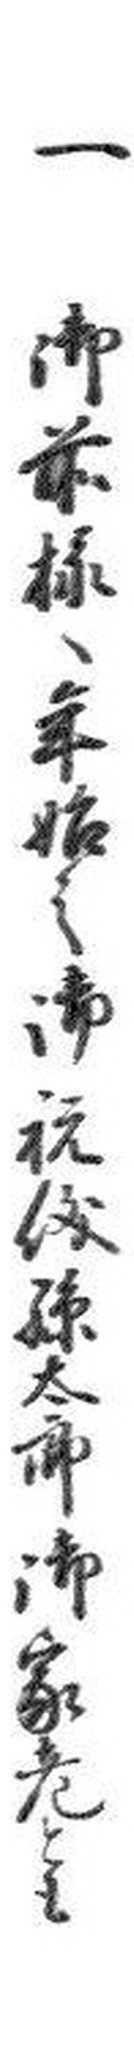一御前様へ年始之御祝儀孫太郎御家老とも
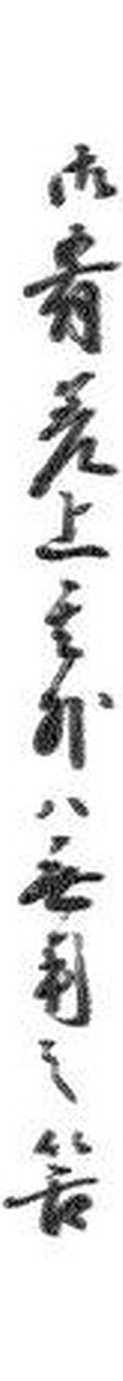御肴差上其外ハ無用之筈
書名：家譜 二十八 吉邦公 従宝永七年七月五日到正徳元年十二月
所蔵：福井県文書館 Fukui Prefectural Archives
